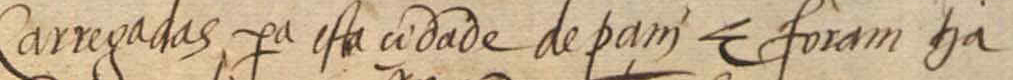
Carregadas ꝑa esta cidade de pam E foram ha
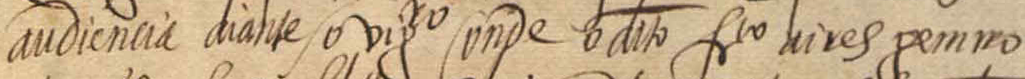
audiençia diante / o vigro / onde o d̅ito frco aires gemrro
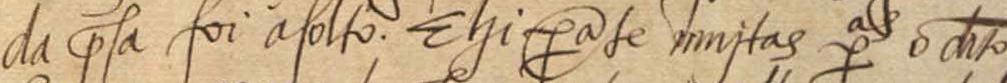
da p̄sa foi a solto. E hi ꝑa̅te mujtas ꝑas o d̅ito
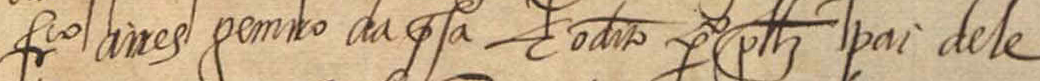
frco aires gemrro da p̄sa E o d̅ito ꝑo g̅llz pai dele
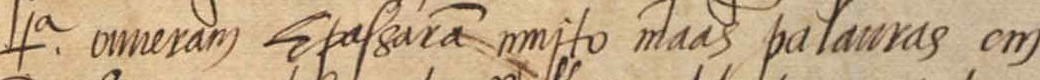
ta. ouueram E passara̅ mujto maas palauras em
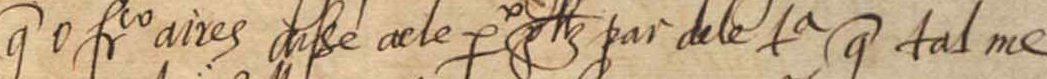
q̅ o frco aires disse a ele ꝑo g̅llz pai dele ta q̅ tal me
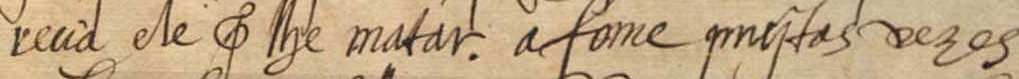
recia ele p̄o lhe matar. a fome mujtas vezes
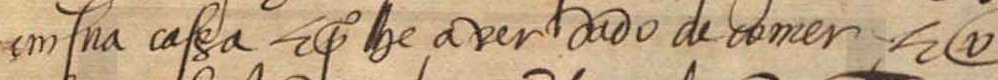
em sua cassa E p̄o lhe aver dado de comer E o
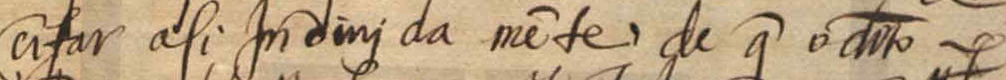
çitar asi Jndiujdame̅te de q̅ o dit̅o ꝑo
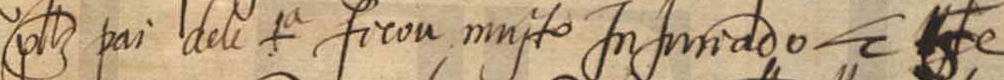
gllz̄ pai dele ta ficou mujto JnJuriado E lhe
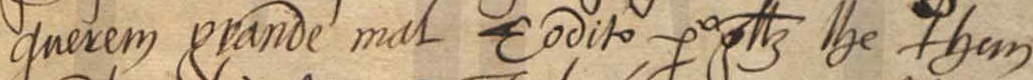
querem grande maL E o dito ꝑo gllz lhe them
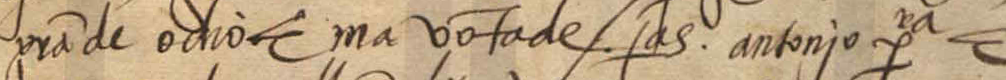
gra̅de odio E ma vo̅tade /. tas. antonjo ꝑra E
